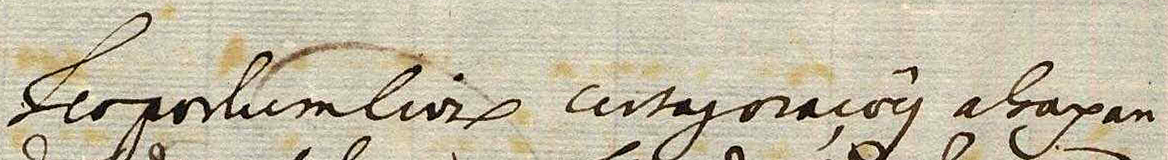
Leo por hum livro certas oraçoês abaxan
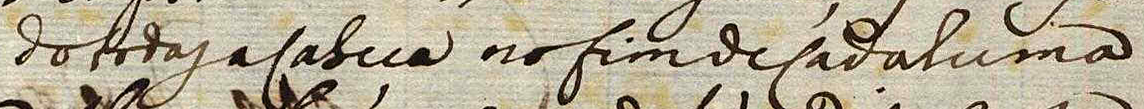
do todas a Cabeça no fim de Cada huma
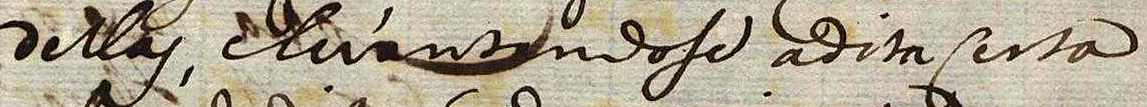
dellas, e levantandose a dita Certa
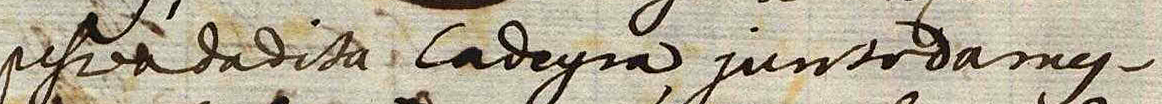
pessoa da dita Cadeyra, junto da mes
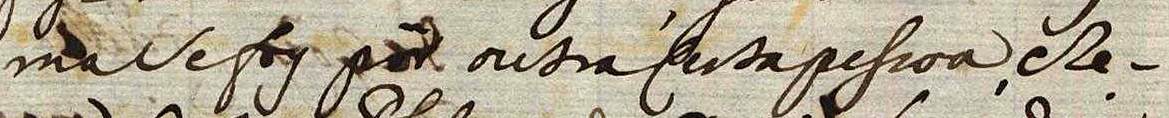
ma se foy pôr outra Certa pessoa, e Re
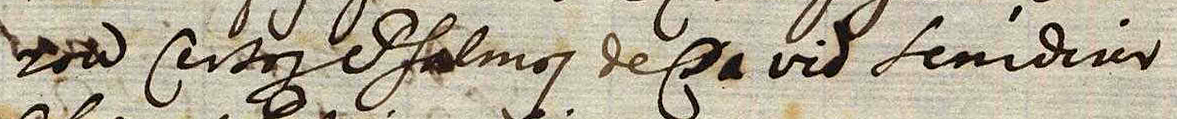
zou Certos Psalmos de David sem diser
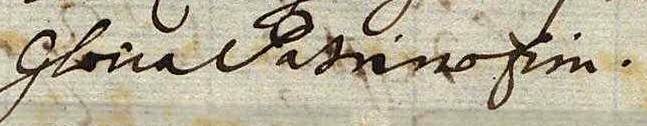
Gloria Patri no fim.
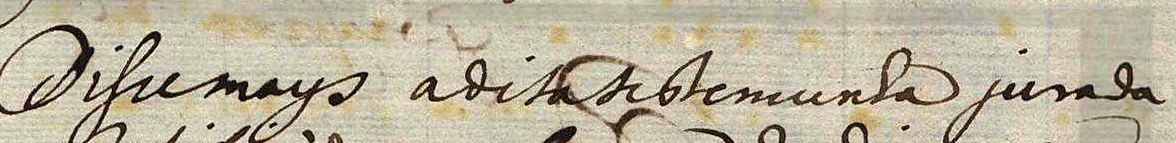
Disse mais a dita testemunha jurada
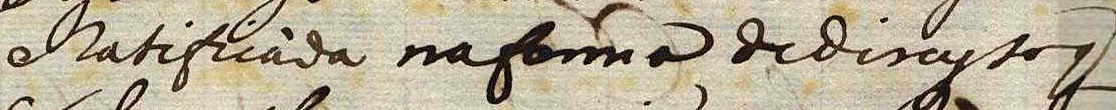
e Ratificáda na forma de direyto q̄
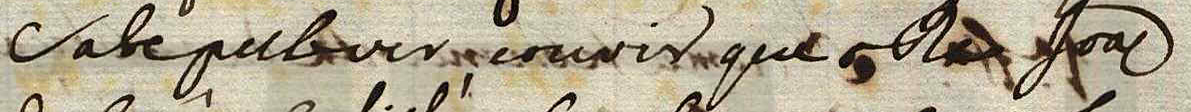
sabe pello ver, e ouvir que o Reo Joaõ
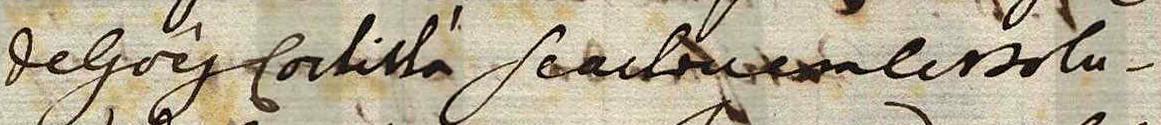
de Goẽs Cochilha, se achou em certo lu
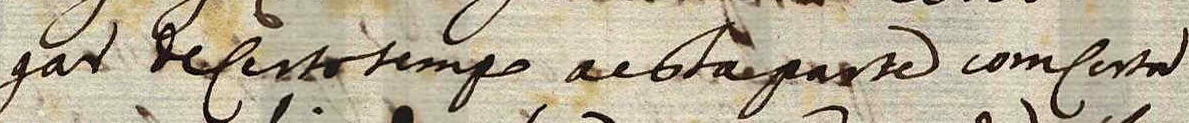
gar de Certo tempo a esta parte com Certa
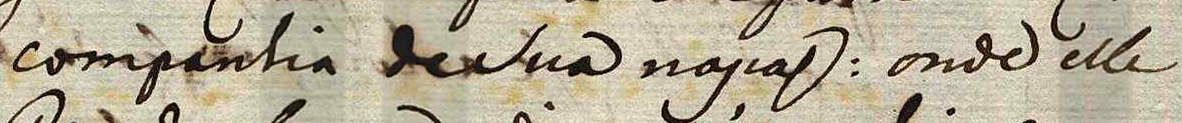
companhia de sua nasçaõ: onde elle
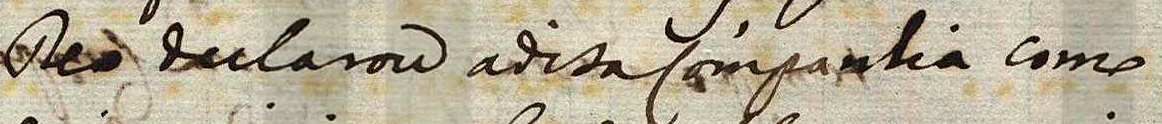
Reo declarou a dita Companhia como
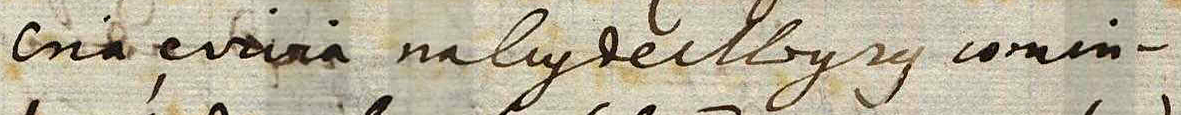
cria e vivia na ley de Moyzes com in
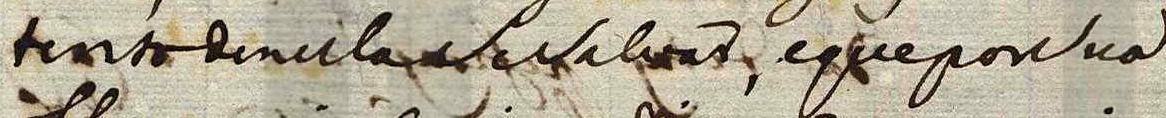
tento de nella se salvar, e que por sua
